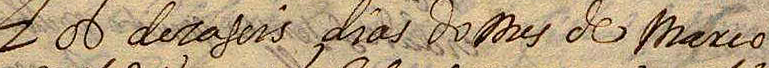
Aos dezaseis dias do mes de Marco
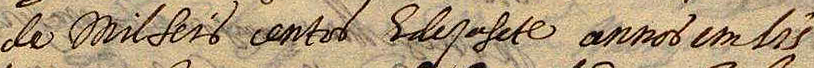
de mil seiscentos e dezasete annos em Lis
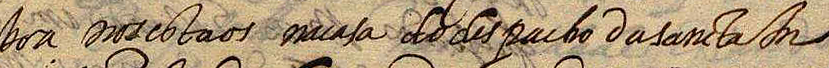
boa nos estaos na casa do despacho da sancta In
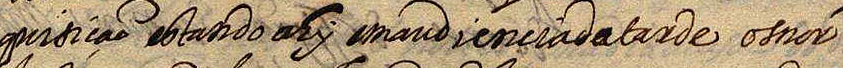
quisição estando ahy em audiencia da tarde o s̄nor
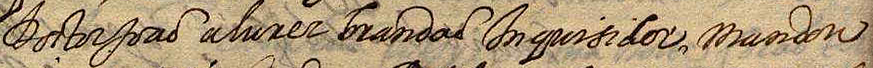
Doctor João Alvrez brandão, Inquisidor, mandou
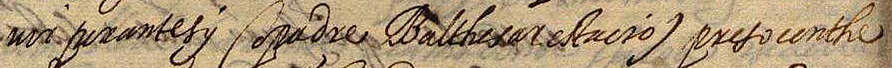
vir perante sy / o padre Balthesar Estacio / preso conthe
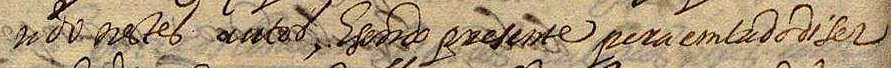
udo nestes autos, e sendo presente pera em tudo diser
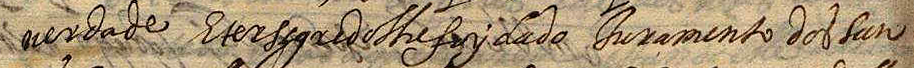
Juram.to verdade e ter segredo lhe foy dado Juramento dos San
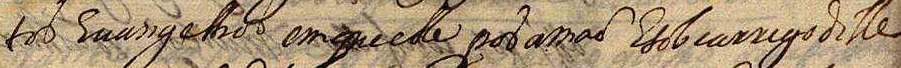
tos Euangelhos em que elle pos a mão e sobcarrego delle
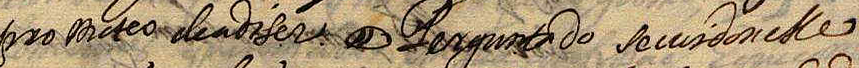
prometeo de a diser / Perguntado se cuidou elle
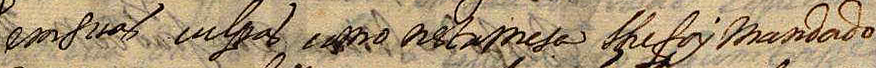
em suas culpas como nesta mesa lhe foy mandado
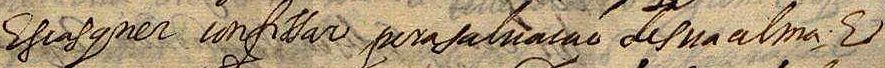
e se as quer confessar pera salvação de sua alma e
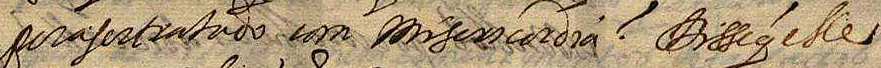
pera ser tratado com misericordia /. Disse q̄ elle
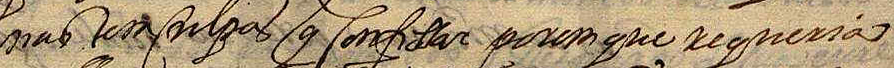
não tem Culpas q̄ confessar porem que requeria
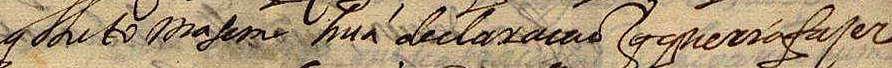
q̄ lhe tomasem hūa /declaraçaõ q̄ queria fazer
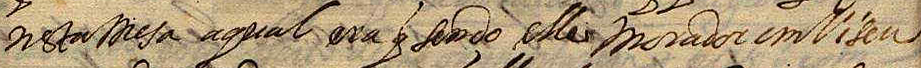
nesta mesa a qual era q̄ sendo elle morador em Viseu
